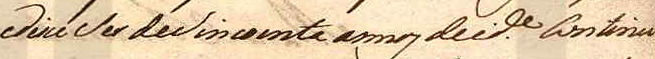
e disse ser de sincoenta annos de id.e Continu
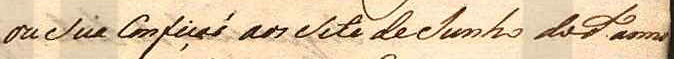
ou sua confiçaõ aos sete de Iunho do d̄.o anno
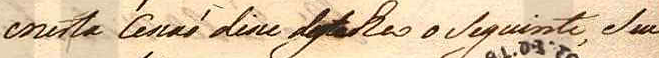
e nesta Cessaõ disse deste Reo o seguinte, seu
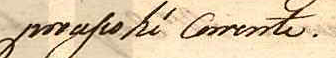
porcesso hé Corrente.
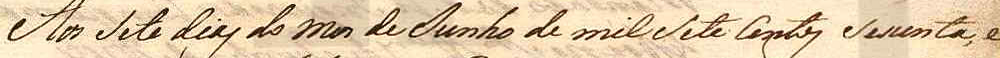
Aos sete dias do mes de Iunho de mil seteCentos sessenta, e
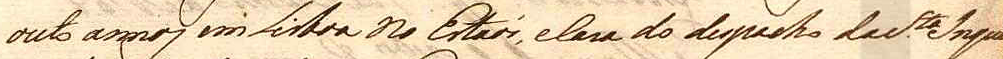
outo annos em Lisboa no Estaos, e Caza do despacho da S.ta Inqui
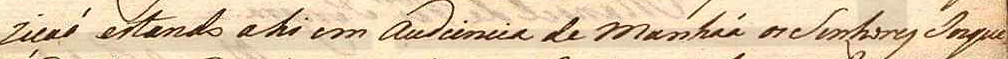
ziçaõ estando ahi em audiencia de manhaã os senhores Inqui
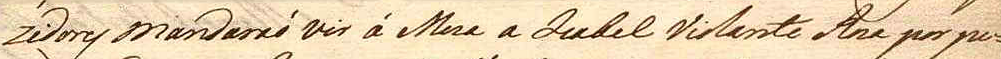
zidores mandaraõ vir á Meza a Izabel Violante Roza por pe
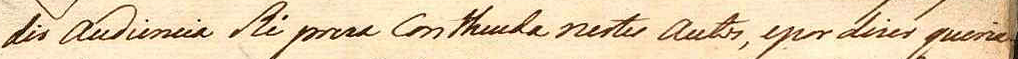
dir Audiencia Ré preza Contheuda nestes Autos, e por dizer queria
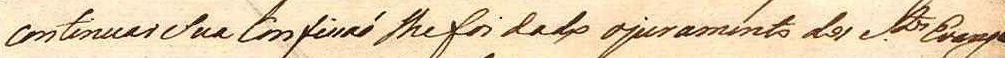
continuar sua confissaõ lhe foi dado o juramento dos S.tos Evange
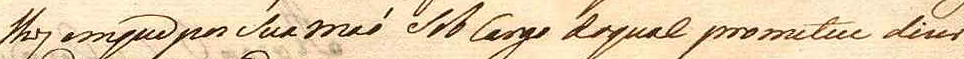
lhos em que pos sua maõ sob Cargo do qual prometeu dizer.
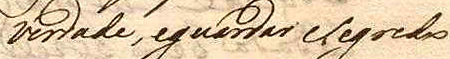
verdade, e guardar segredo.
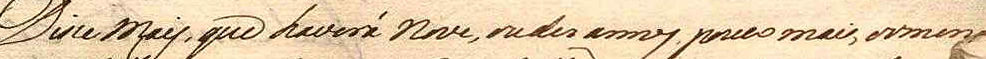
Disse mais, que haverá nove, ou dez annos, pouco mais, ou men
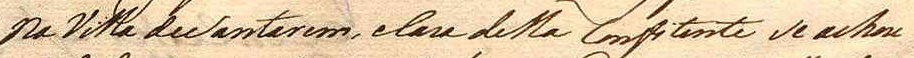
na Villa de Santarem, e Caza della Confitente se achou
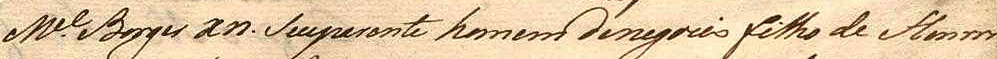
M.el Borges x n. seu parente homem de negocio filho de Henrri
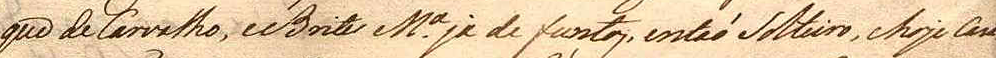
que de Carvalho, e Brite M.a ja defuntos, entaõ solteiro, e hoje Casa
